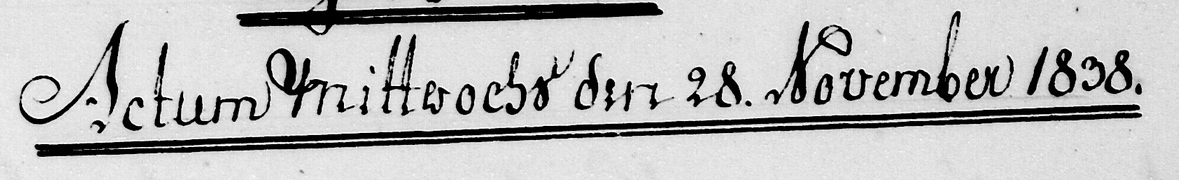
Actum Mittwochs den 28. November 1838.
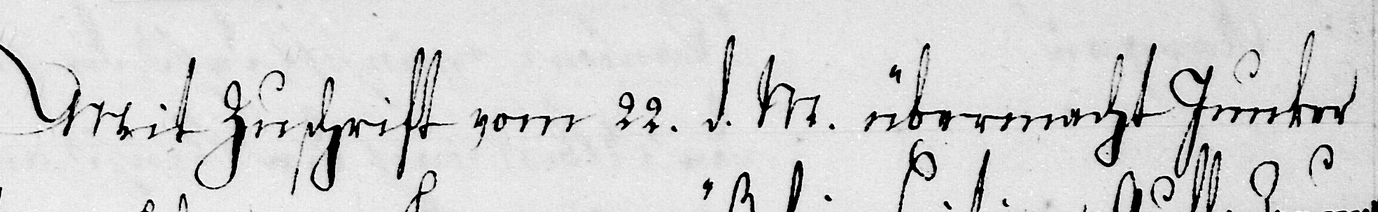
Mit Zuschrift vom 22. d. M. übermacht Junker
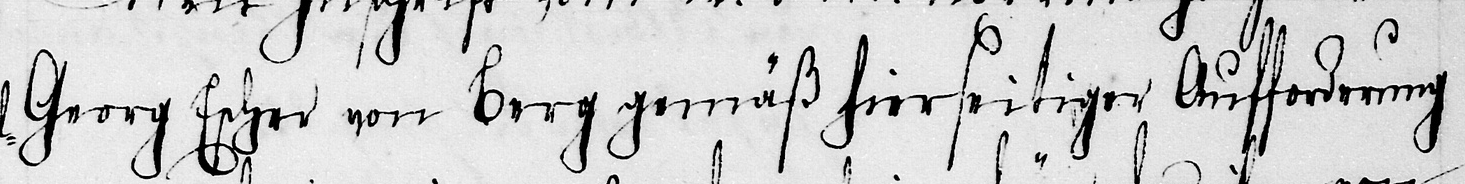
Georg Escher von Berg gemäß hierseitiger Aufforderung
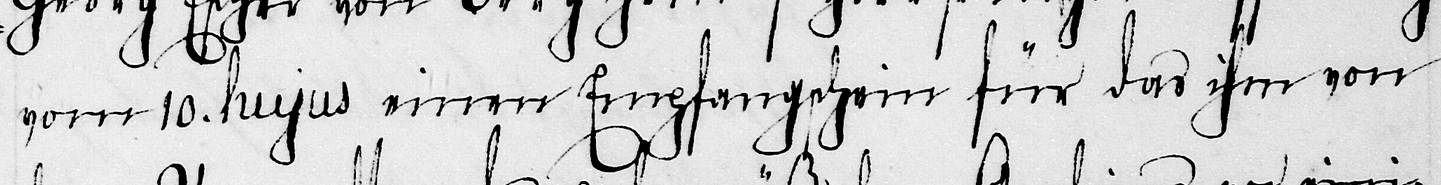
vom 10. hujus einen Empfangschein für das ihm von
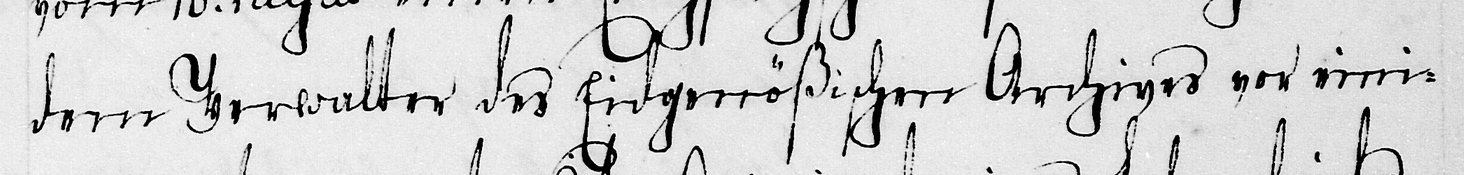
dem Verwalter des Eidgenößischen Archives vor eini¬
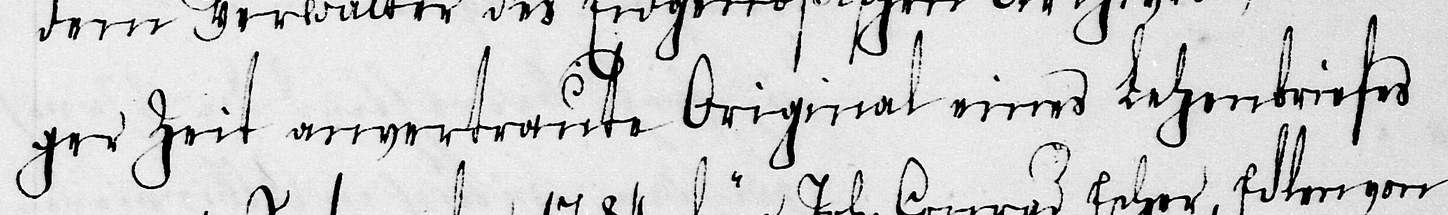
ger Zeit anvertraute Original eines Lehenbriefes
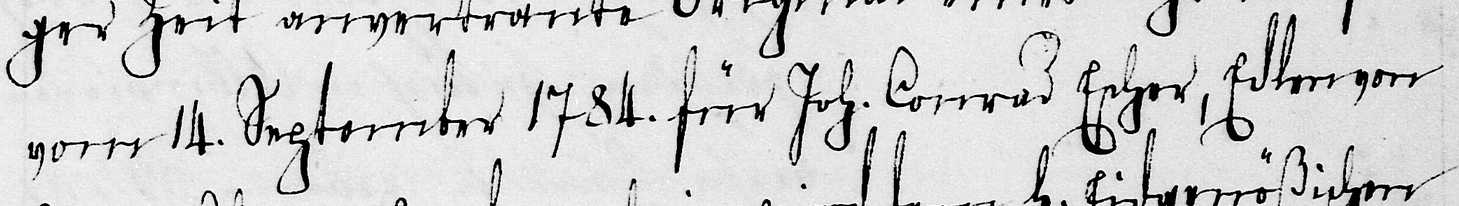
vom 14. September 1784. für Joh. Conrad Escher, Edlen von
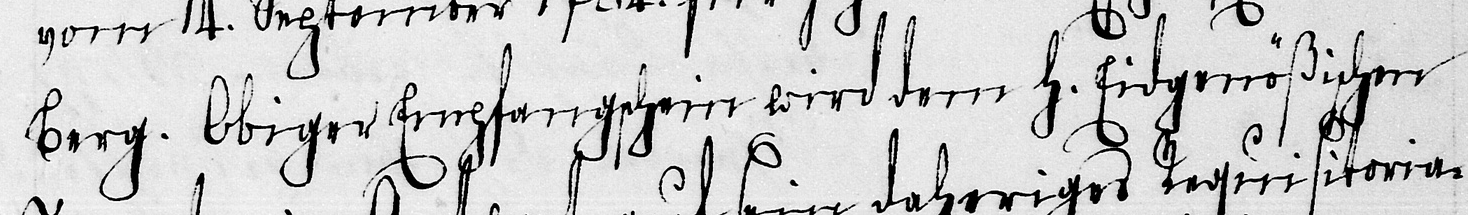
Berg. Obiger Empfangschein wird dem H. Eidgenößischen
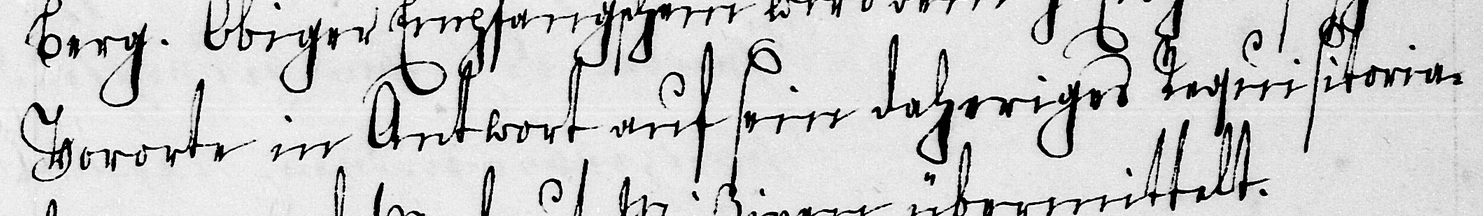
Vororte in Antwort auf sein daheriges Requisitoria¬
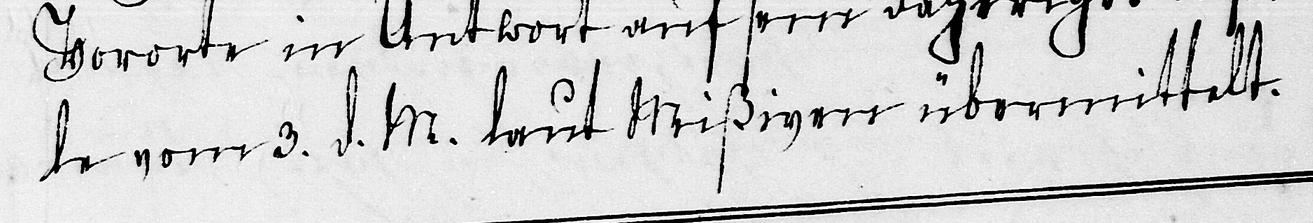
le vom 3. d. M. laut Mißiven übermittelt.
